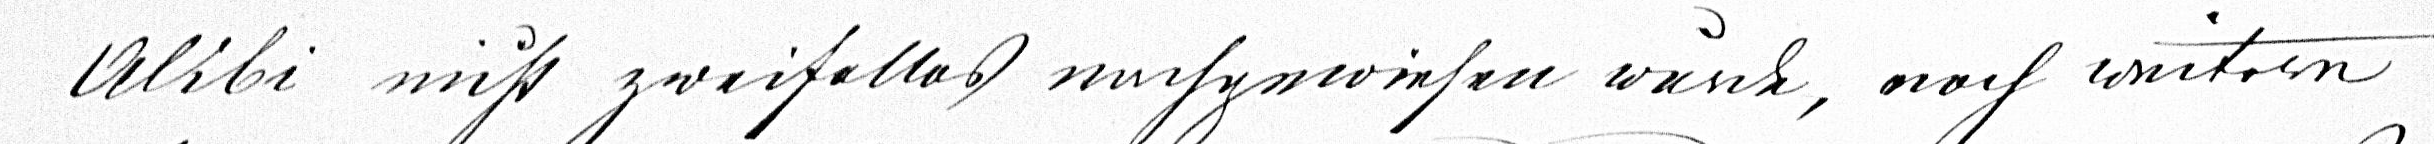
Alibi nicht zweifellos nachgewiesen wurde, noch weitern
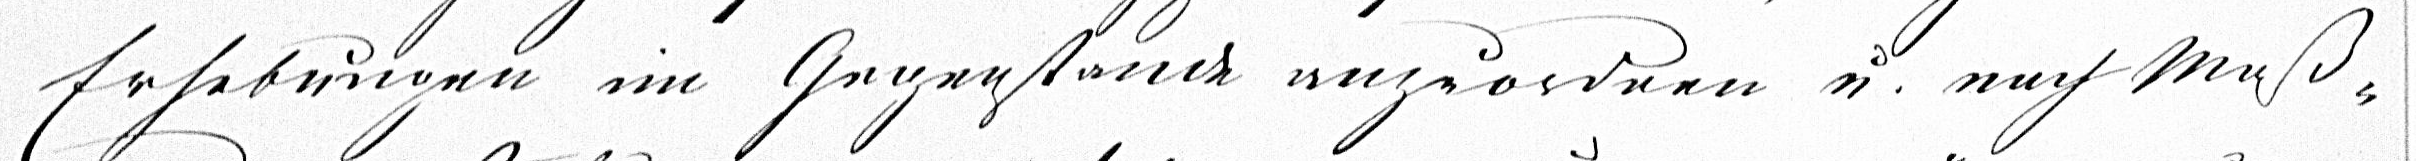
Erhebungen im Gegenstande angeordnen u. nach Maß¬
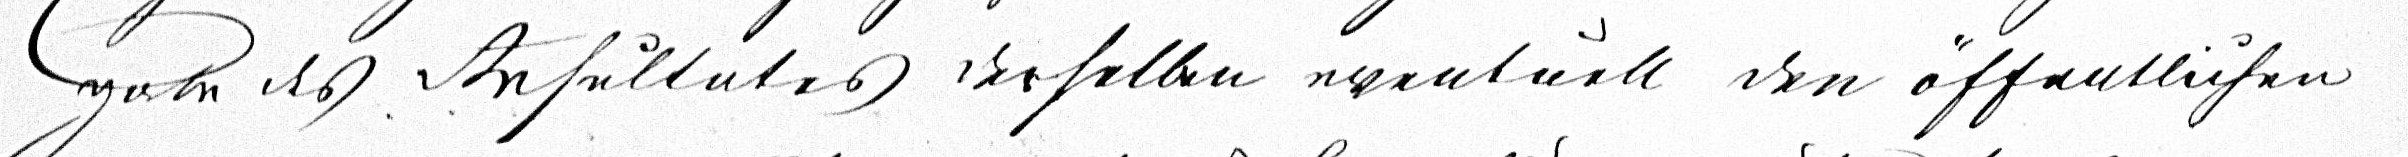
gabe des Resultates derselben eventuell den öffentlichen
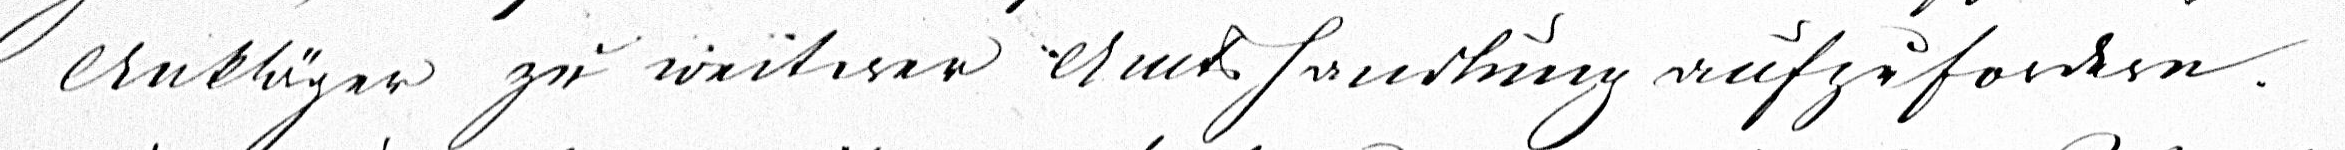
Ankläger zu weiterer Amtshandlung aufzufordern.
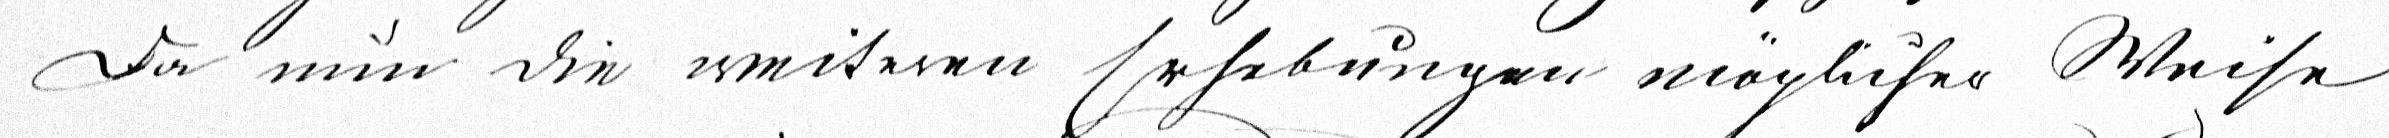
Da nun die weiteren Erhebungen möglicher Weise
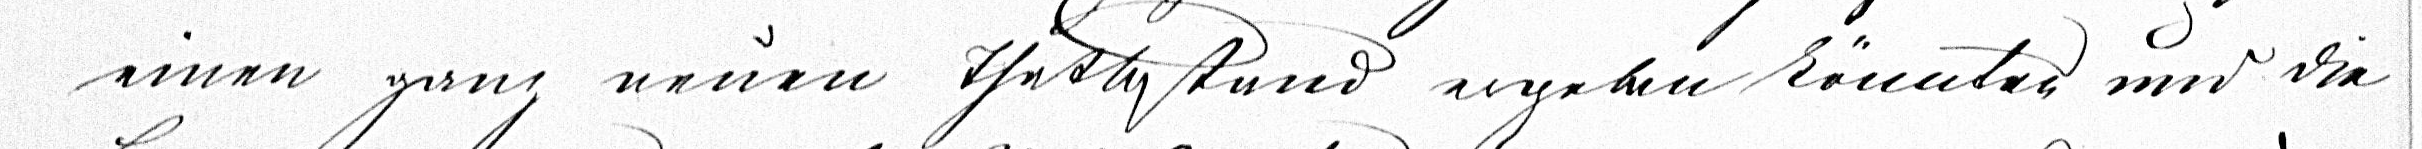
einen ganz neuen Thatbestand ergeben könnten und die
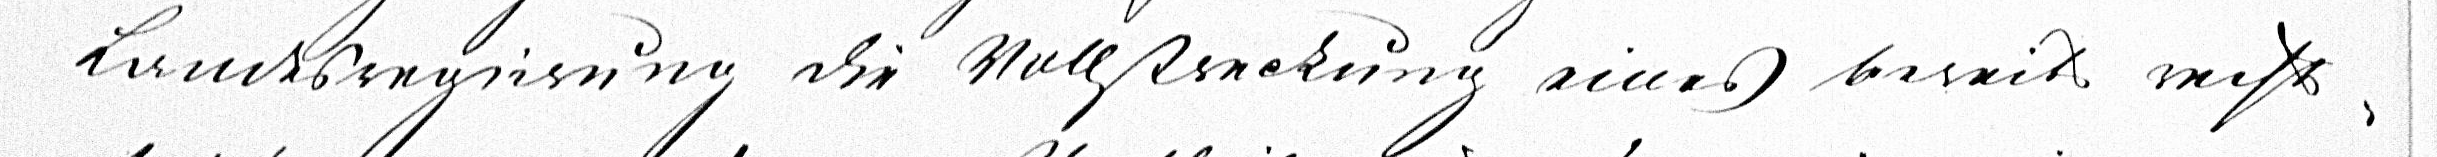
Landsregierung die Volstreckung eines bereits recht¬
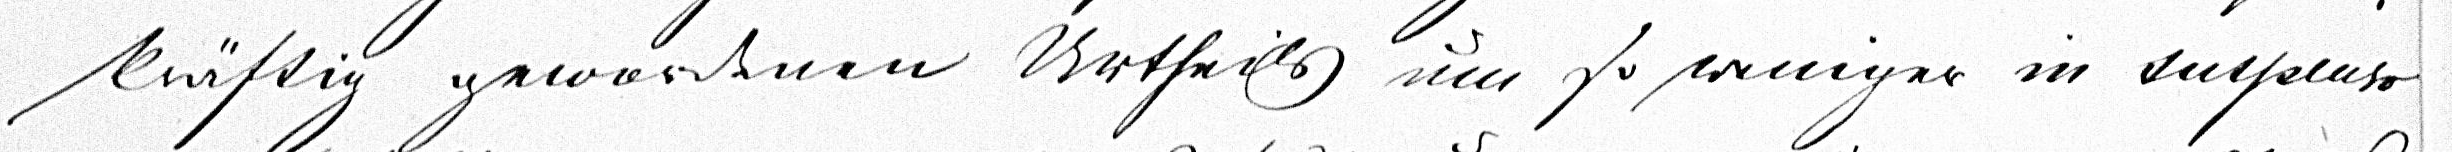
kräftig gewordenen Urtheils um so weniger in xx
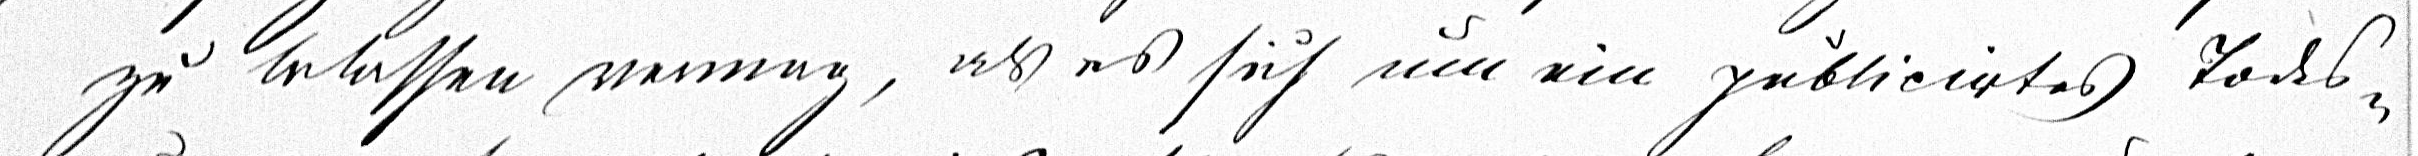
zu belassen xx, als es sich um ein publicirtes Todes¬
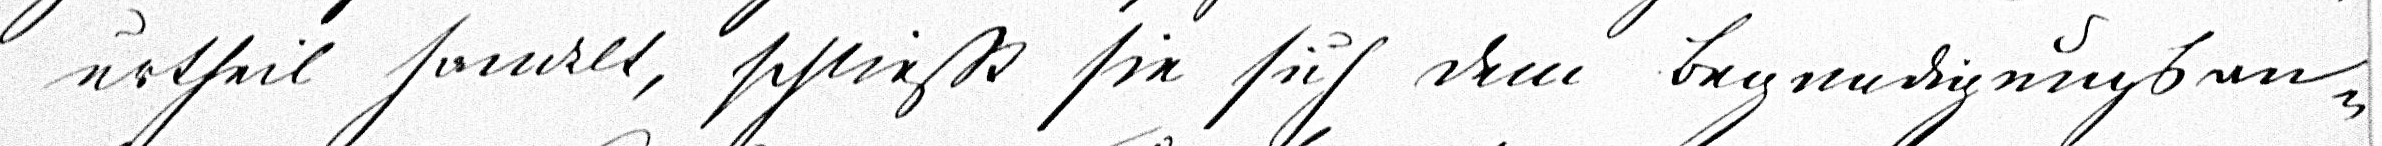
urtheil hoxx, schließ sie sich dem Begnadigungsan¬
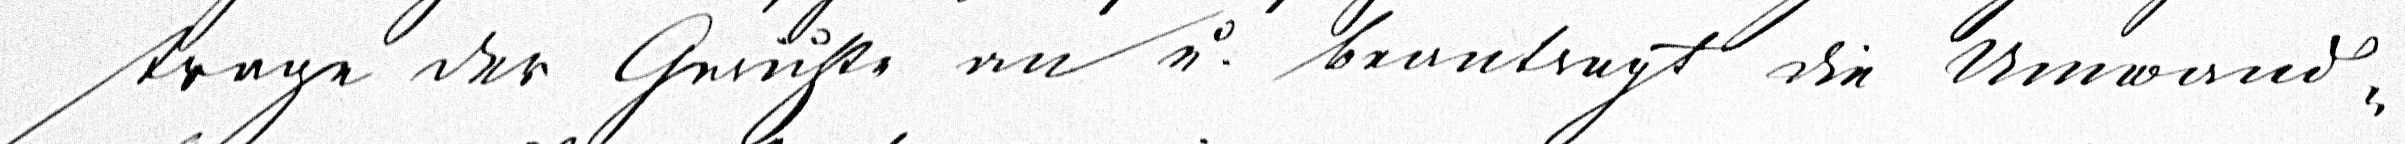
trage der Gerichte an u. beantragt die Umwand¬
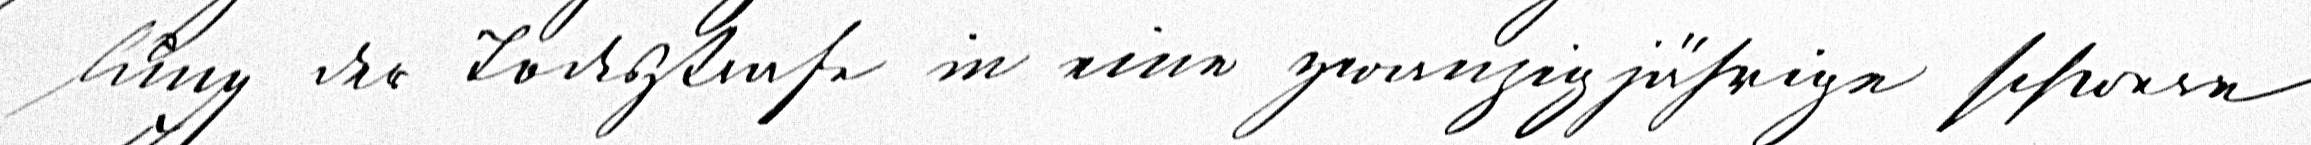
lung der Todesstrafe in eine zwanzigjährige schwere
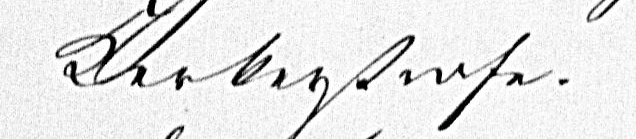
Kerkerstrafe.
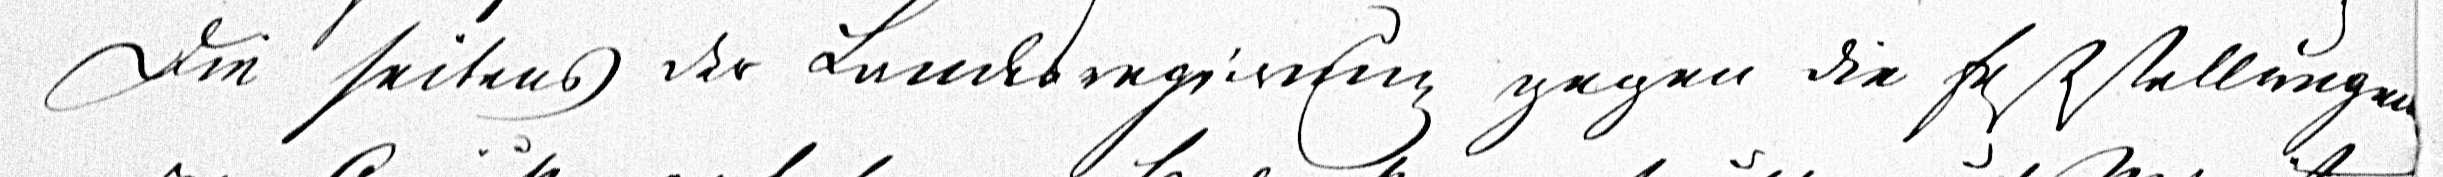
Die seitens der Landesregierung gegen die Feststellungen
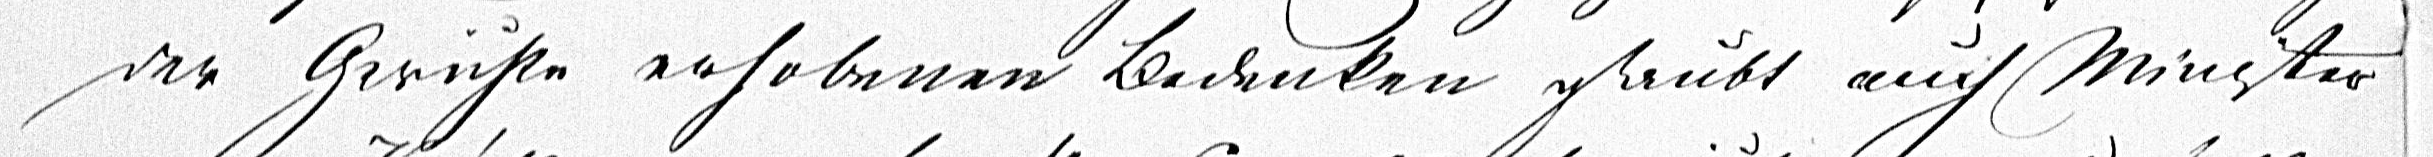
der Gerichte erhobenen Bedanke glaubt auch Minister
